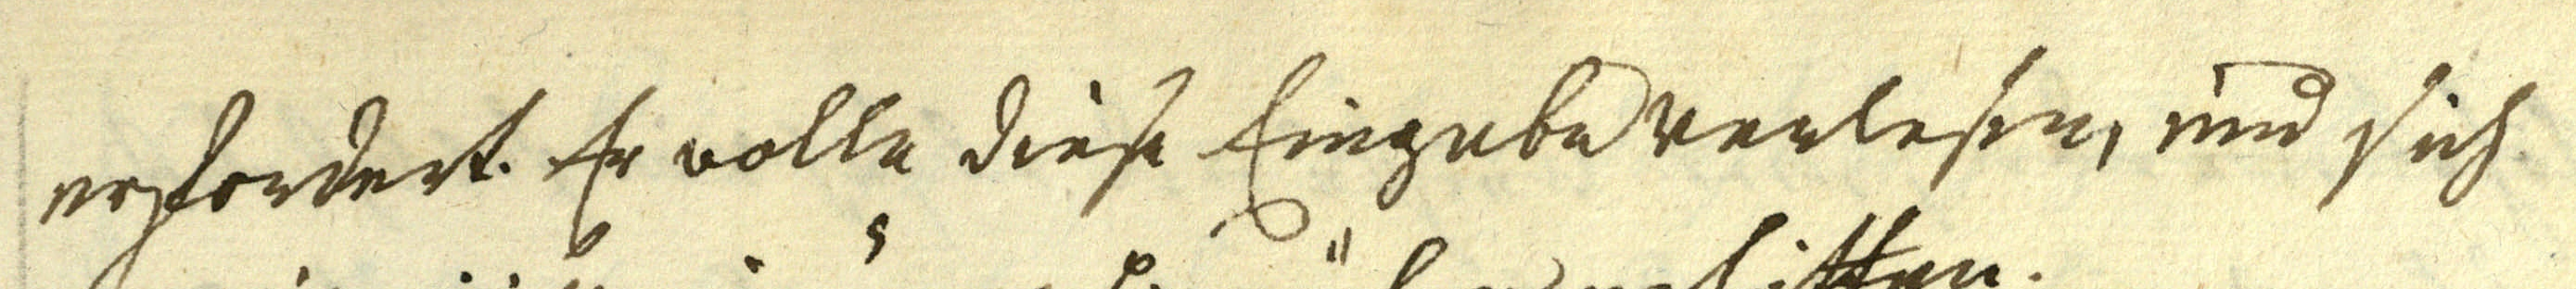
erfordert. Er wolle diese Eingabe verlesen, und sich
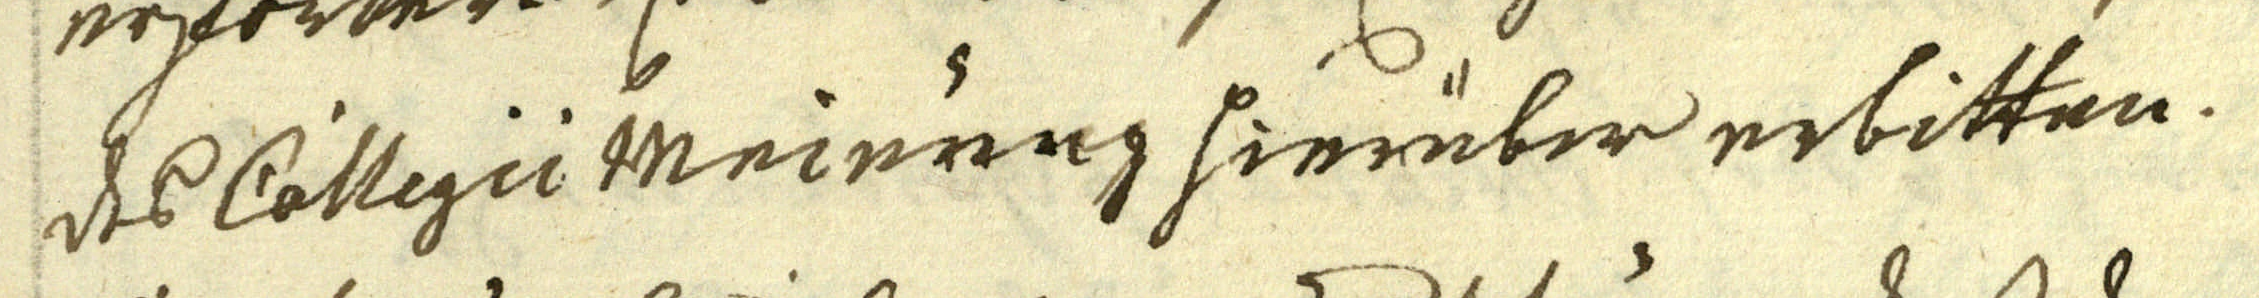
des Collegii Meinung hierüber erbitten.
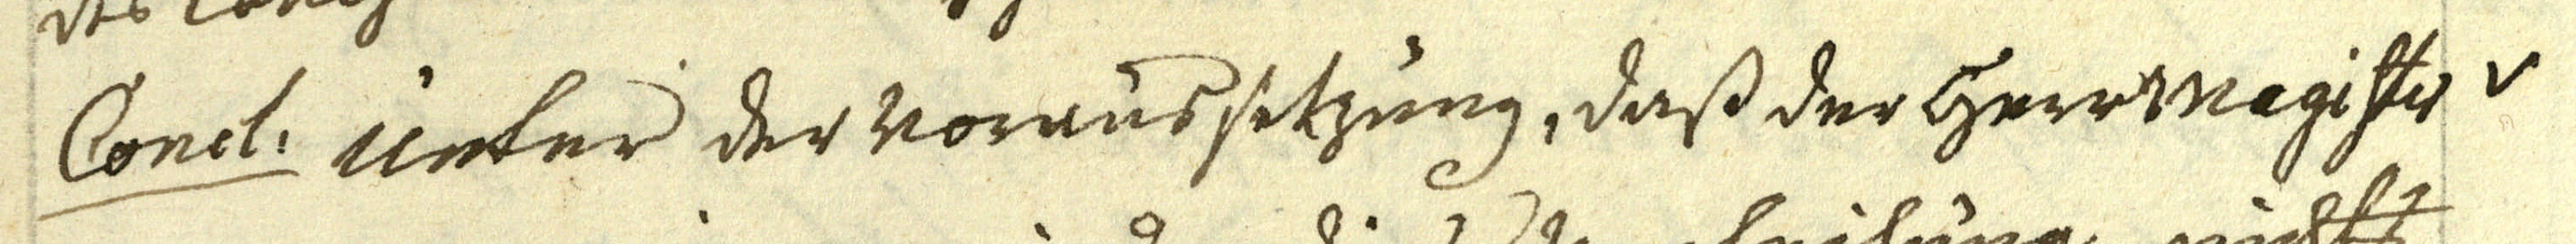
Concl. Unter der Voraussetzung, daß der Herr magister
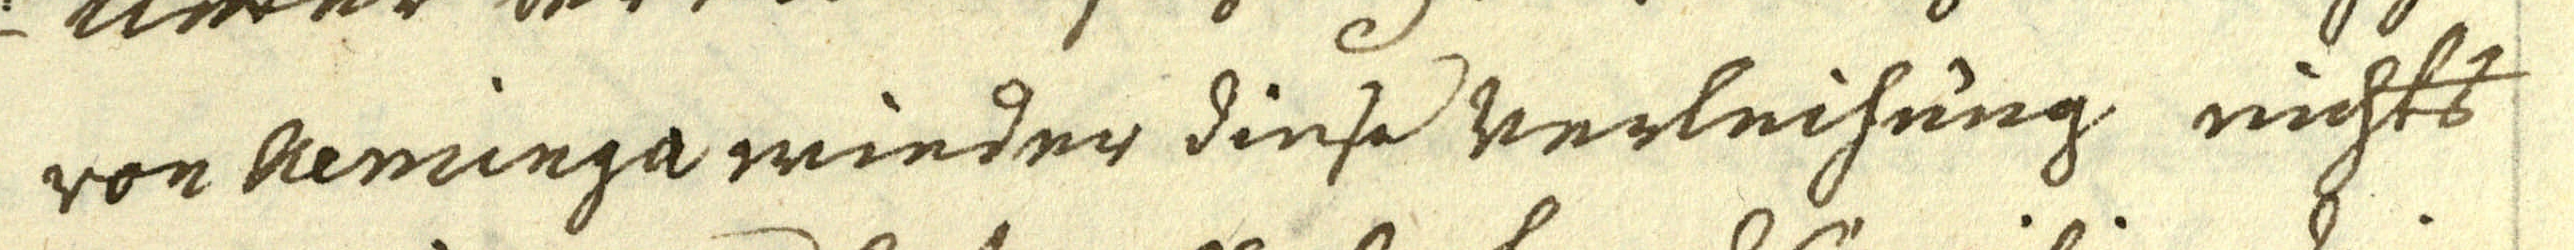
von Aeminga wieder diese Verleihung nichts
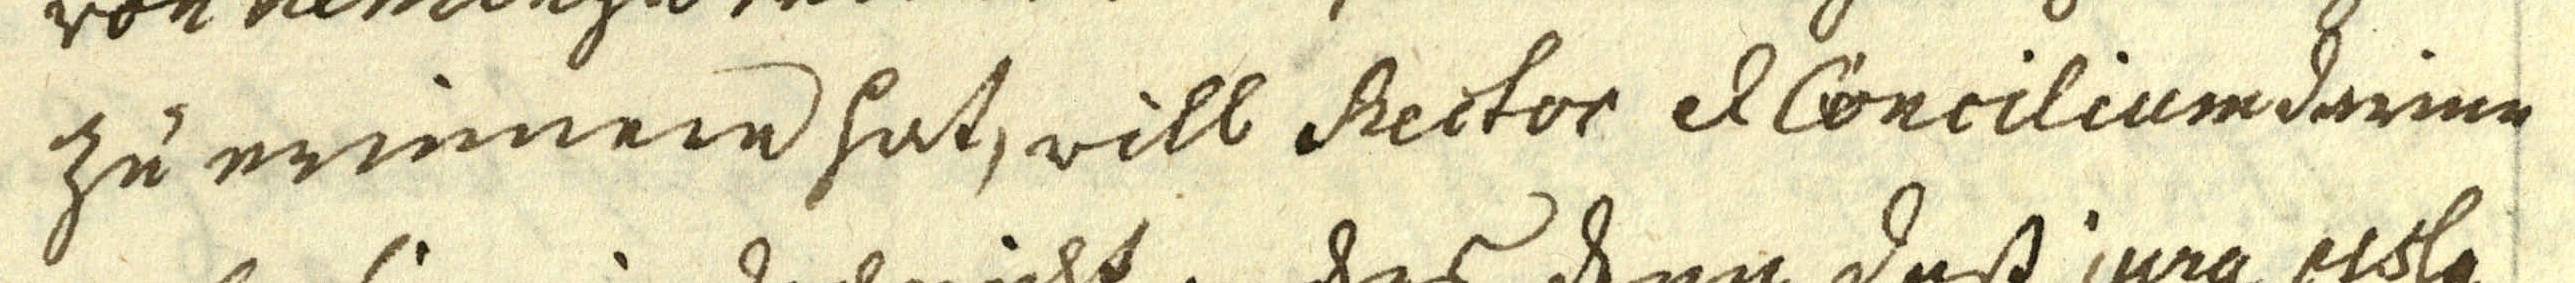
zu erinnern hat, will Rector et Concilium darinn
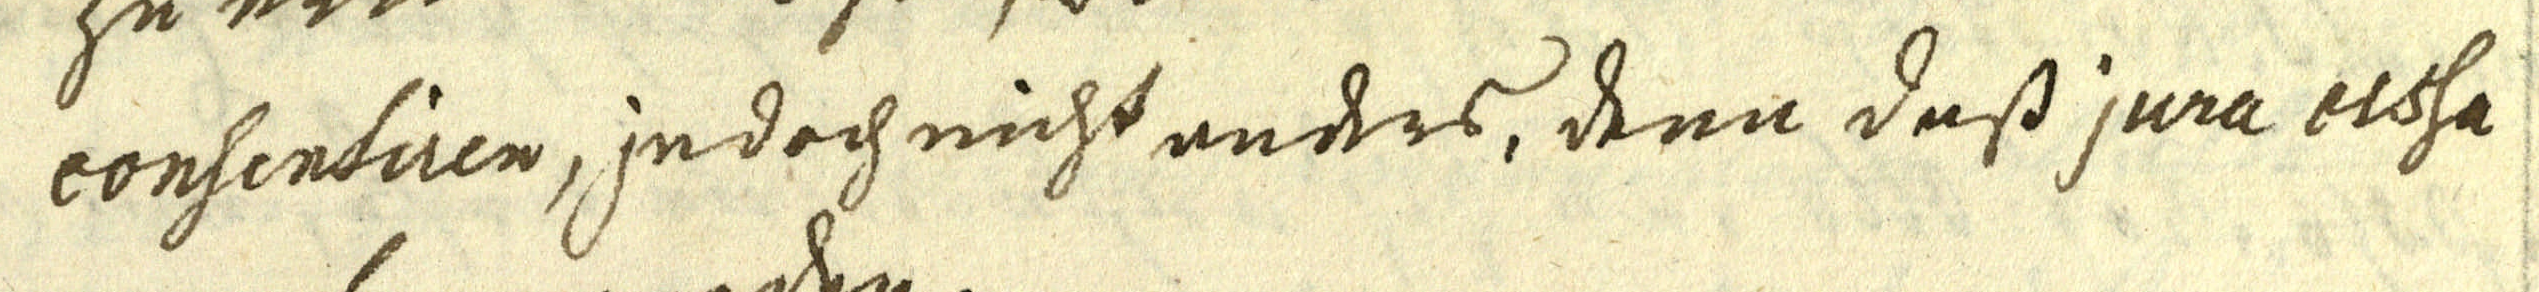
consentiren, jedoch nicht anders, denn daß jura cessa
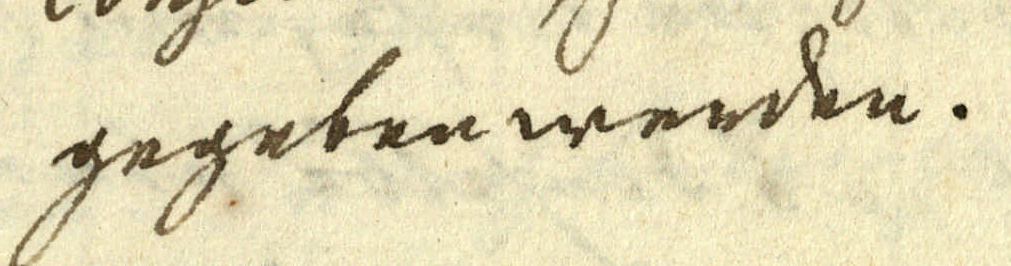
gegeben werden.
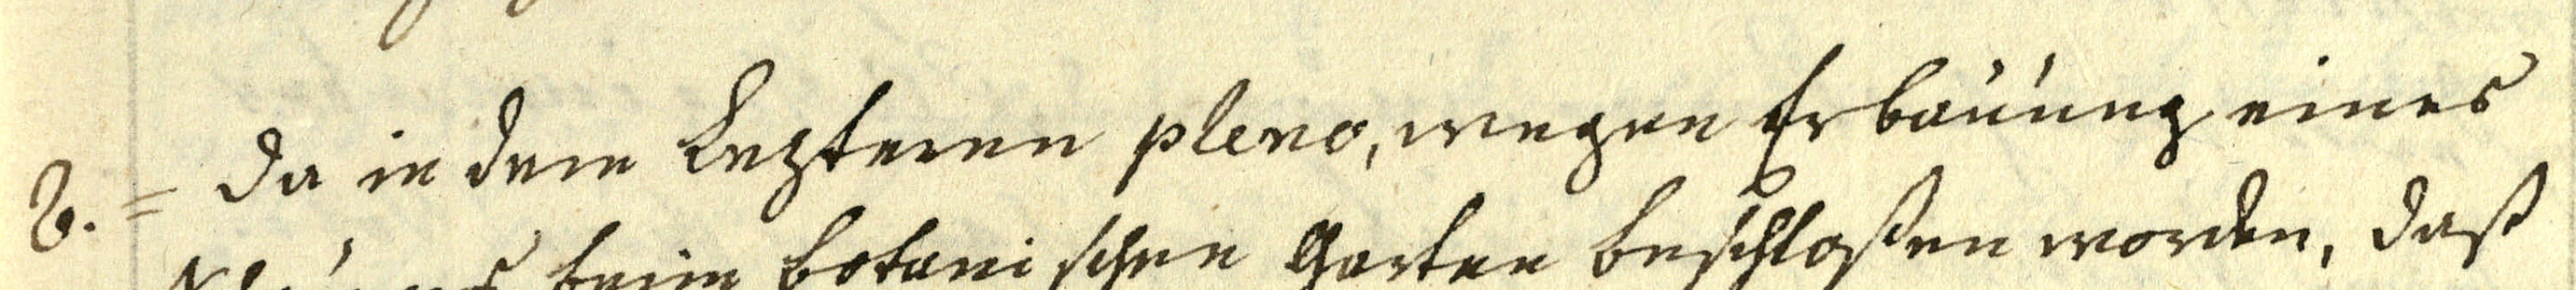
8. Da in dem Lezteren pleno, wegen Erbauung eines
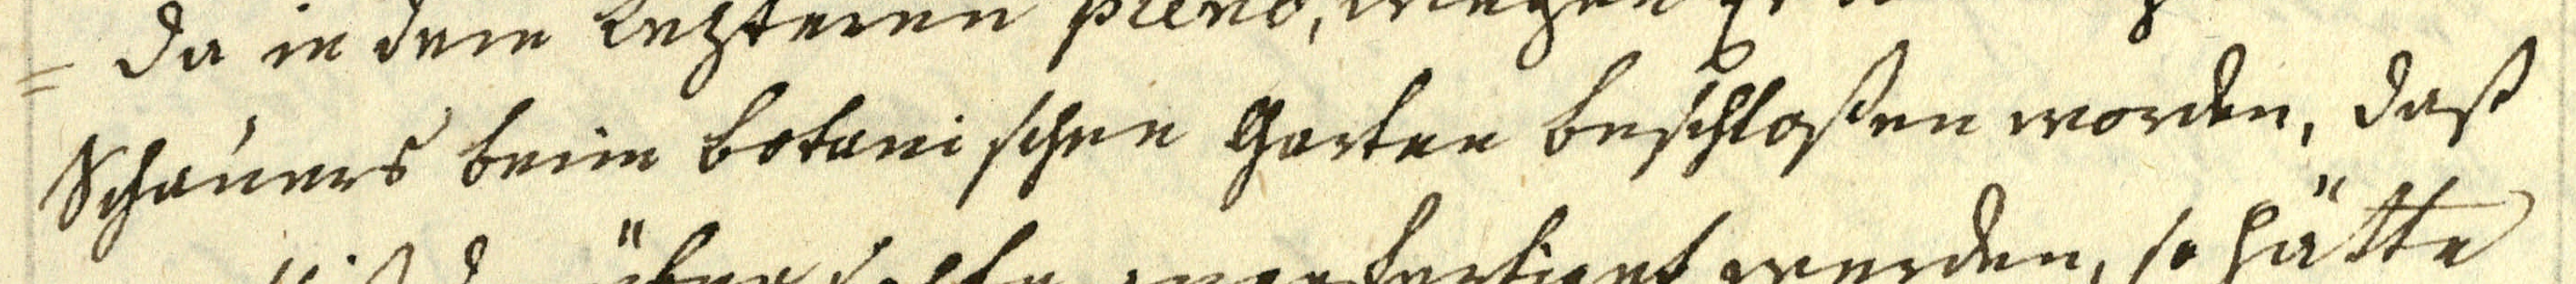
Schauers beim Botanischen Garten beschloßen worden, daß
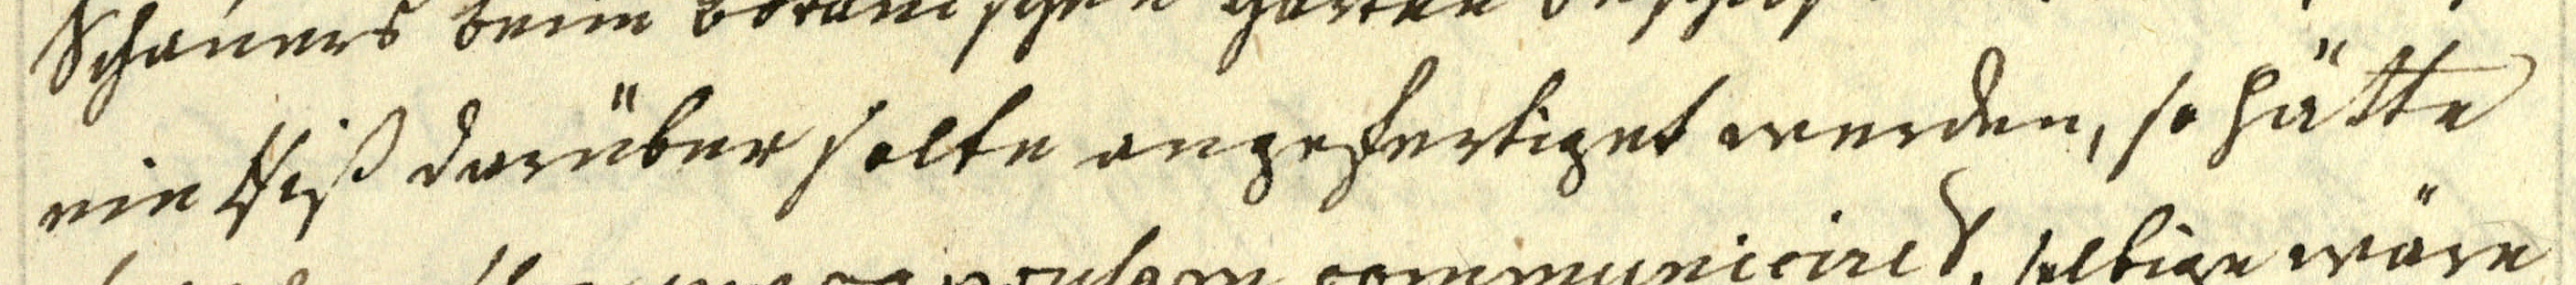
ein Riß darüber solte angefertiget werden, so hätte
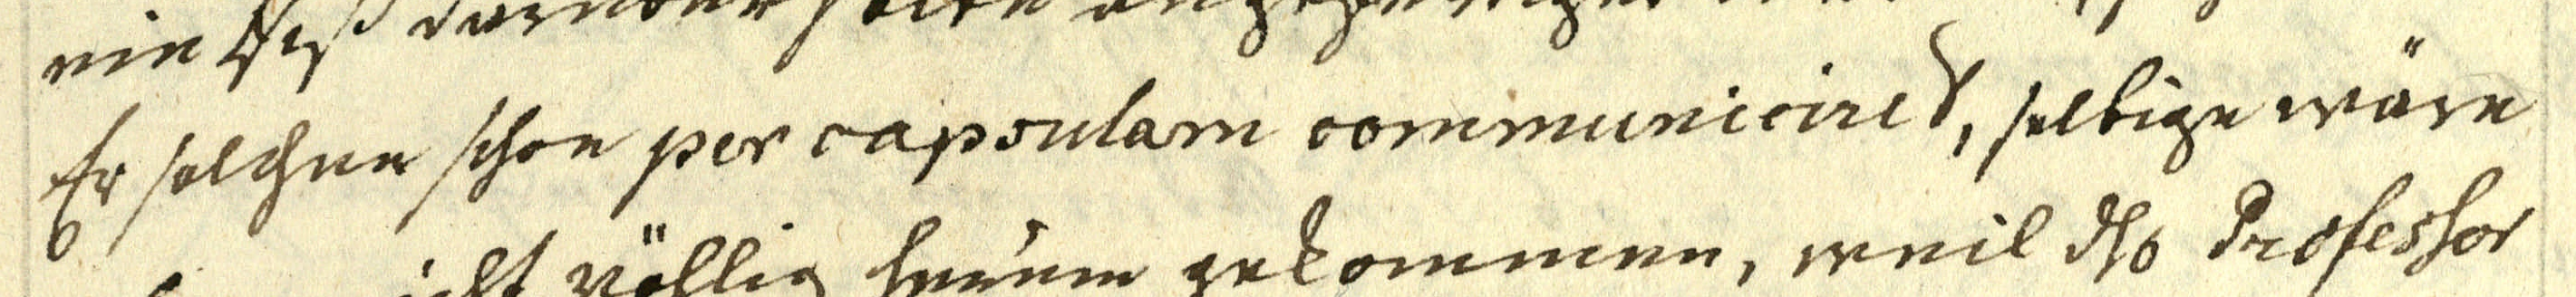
Er solchen schon per capsulam communiciret, selbige wäre
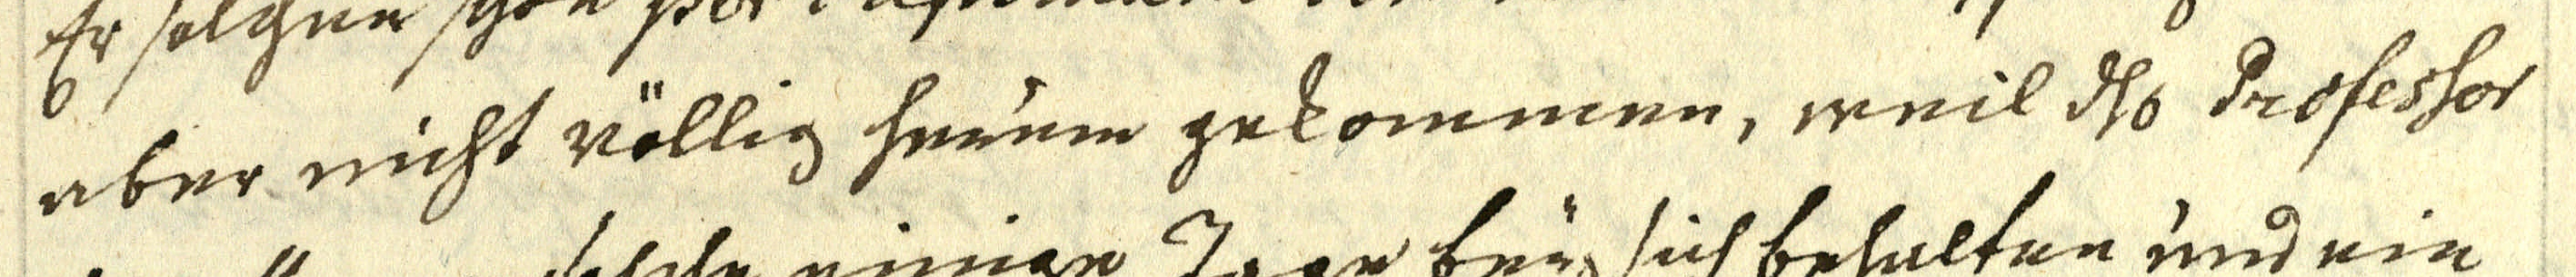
aber nicht völlig herum gekommen, weil dh Professor
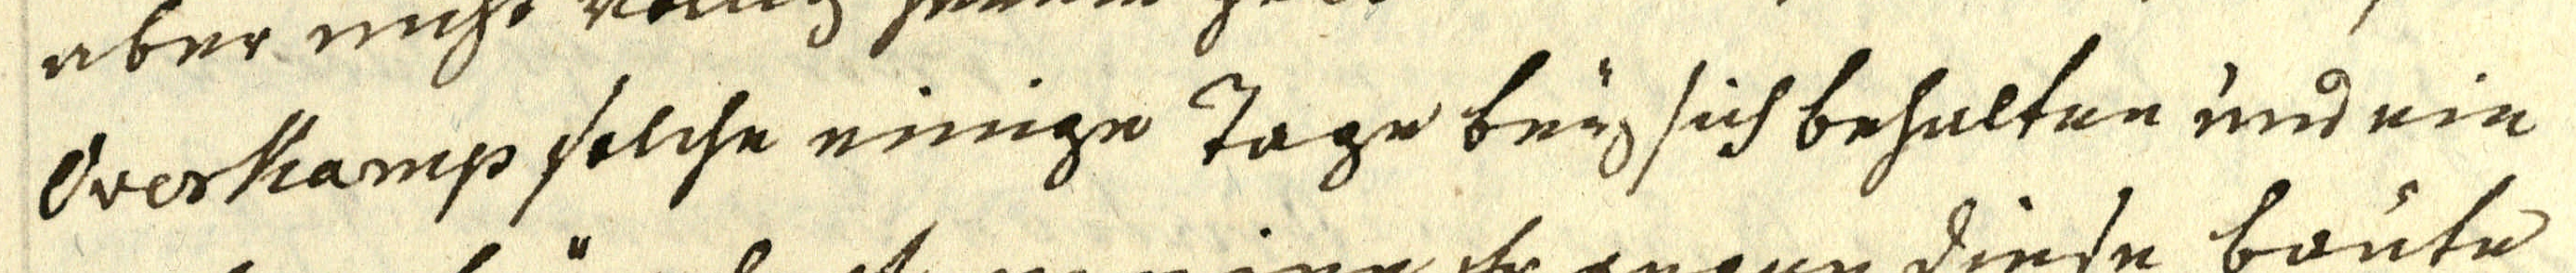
Overkamp solche einige Tage beÿ sich behalten und ein
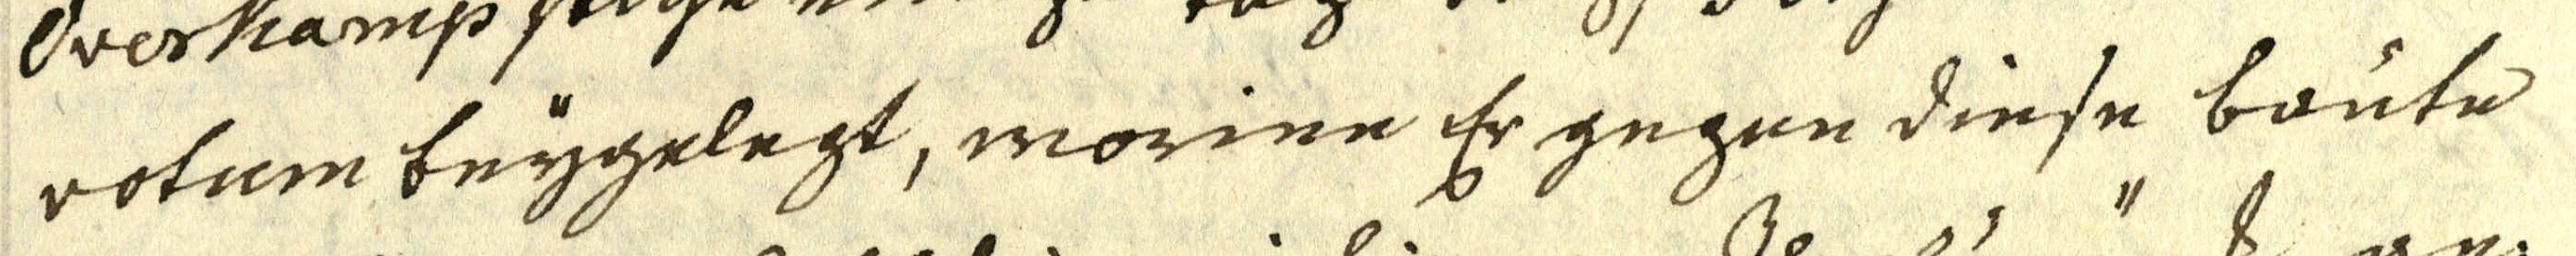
votum beÿgelegt, worin Er gegen diese Baute
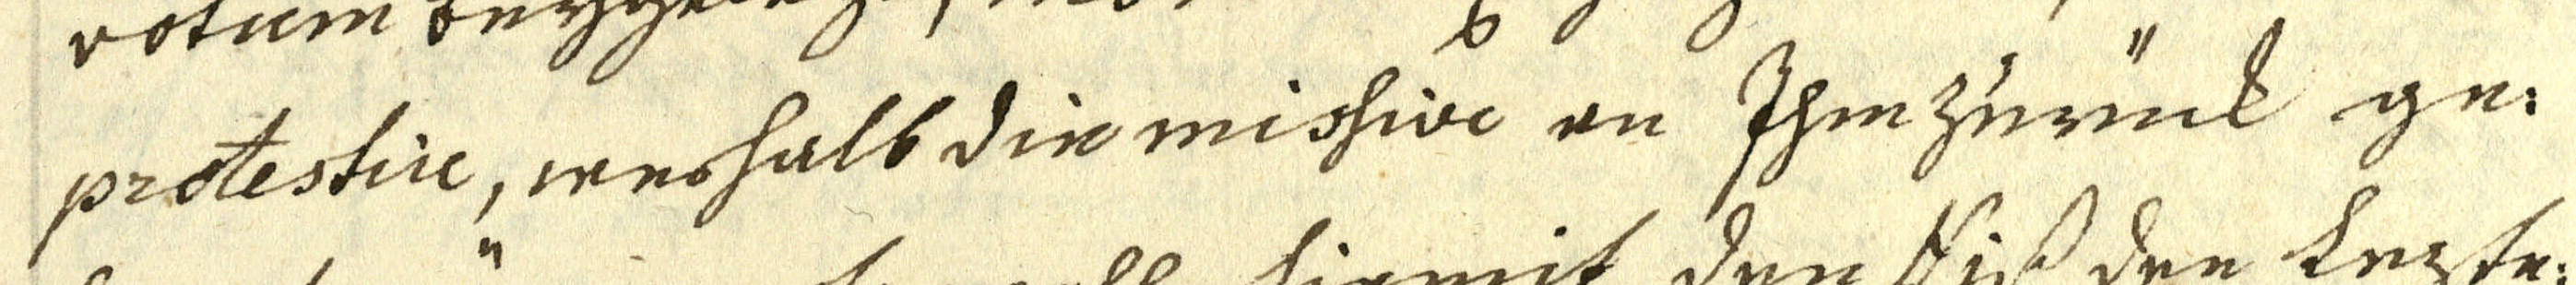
protestire, weshalb die missive an Ihm zurück ge¬
